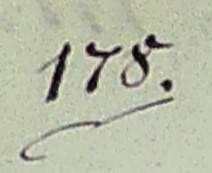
178.
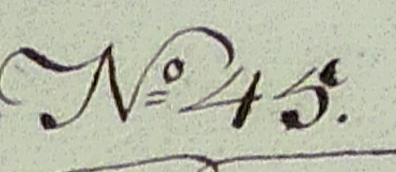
No͇ 45.
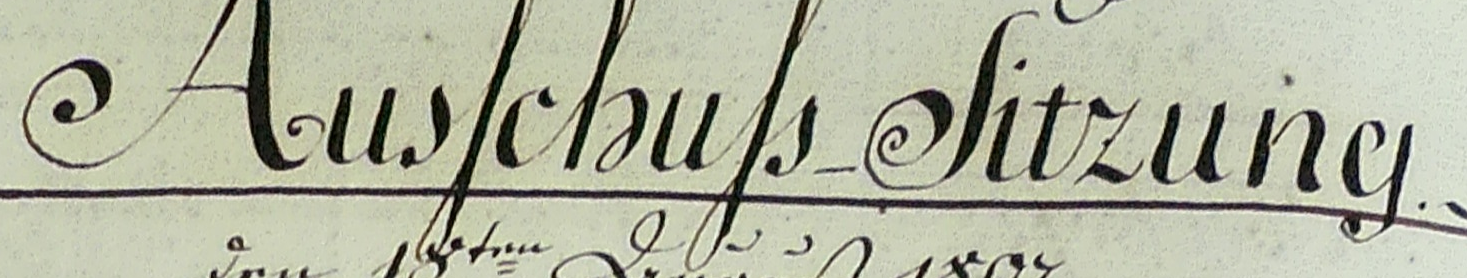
Ausschuss‗Sitzung.
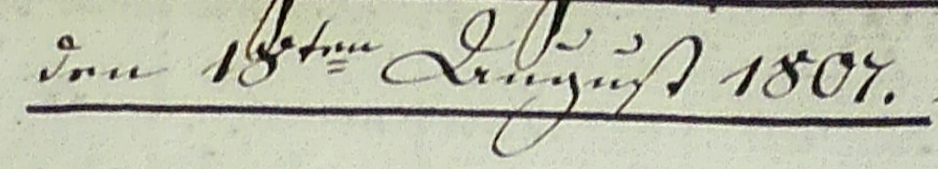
den 18te͇n August 1807.
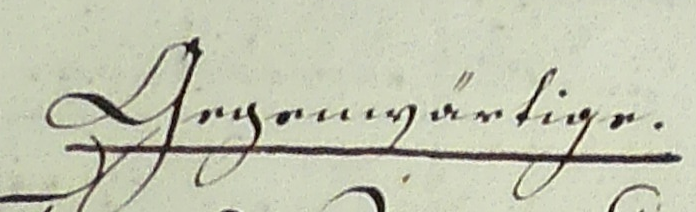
Gegenwärtige.
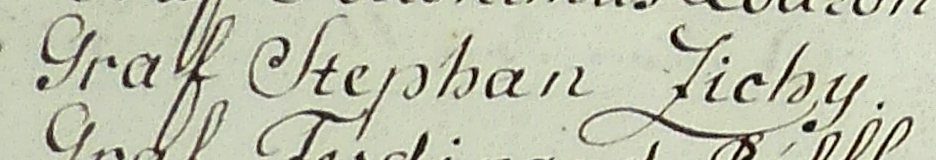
Graf Stephan Zichy.
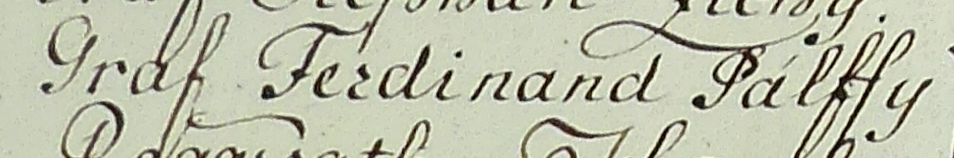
Graf Ferdinand Pálffy
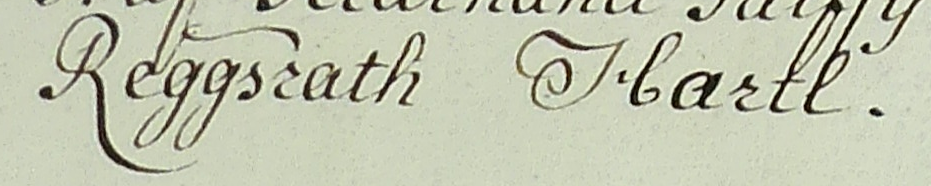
Reg͞gsrath Hartl.
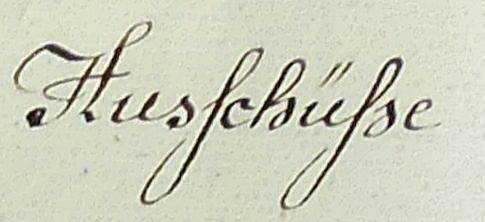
Ausschüsse
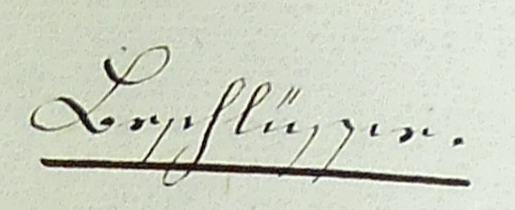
Beschlüsse.
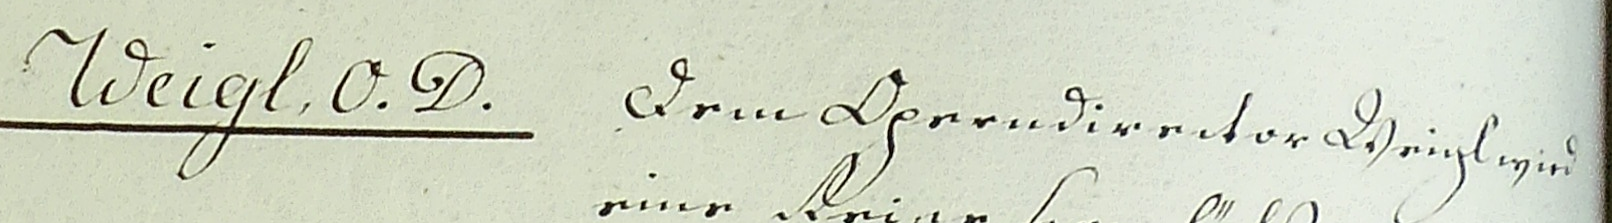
Weigl, O. D. Dem Operndirector Weigl wird
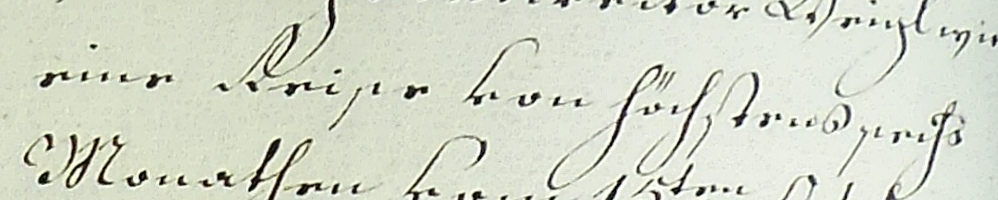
eine Reise von höchstens sechs
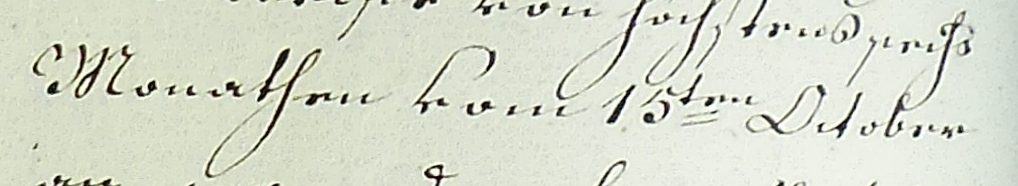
Monathen vom 15te͇n October
